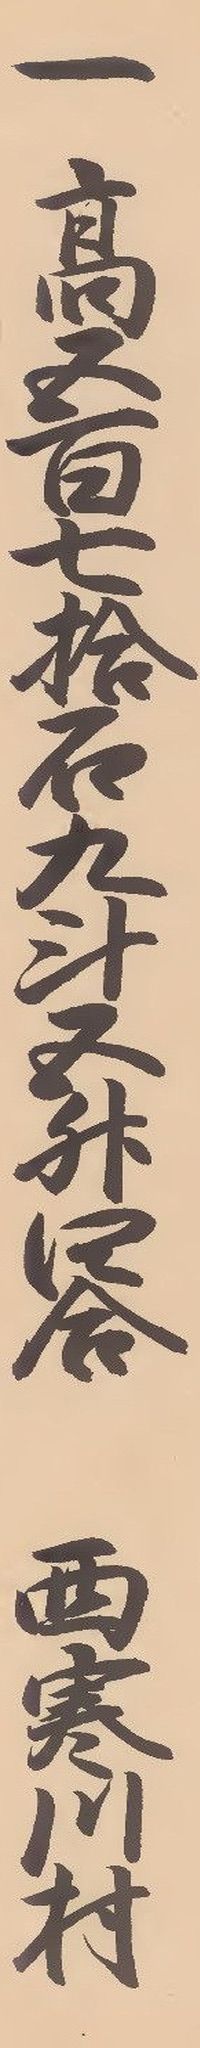一高五百七拾石九斗五升四合西寒川村
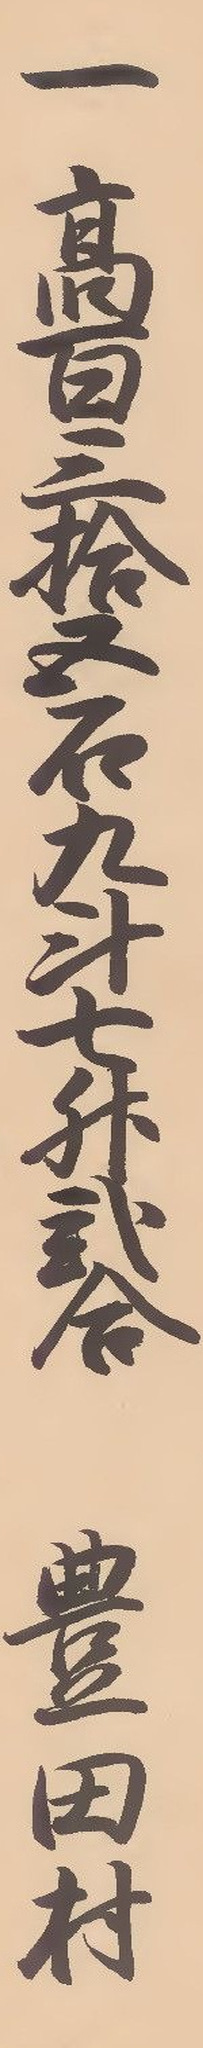一高百三拾五石九斗七升弐合豊田村

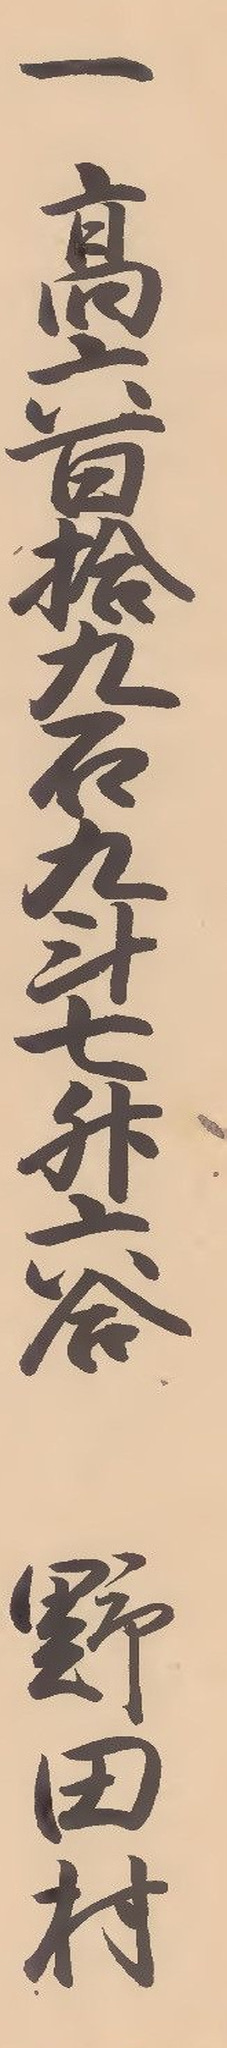一高六百拾九石九斗七升六合野田村
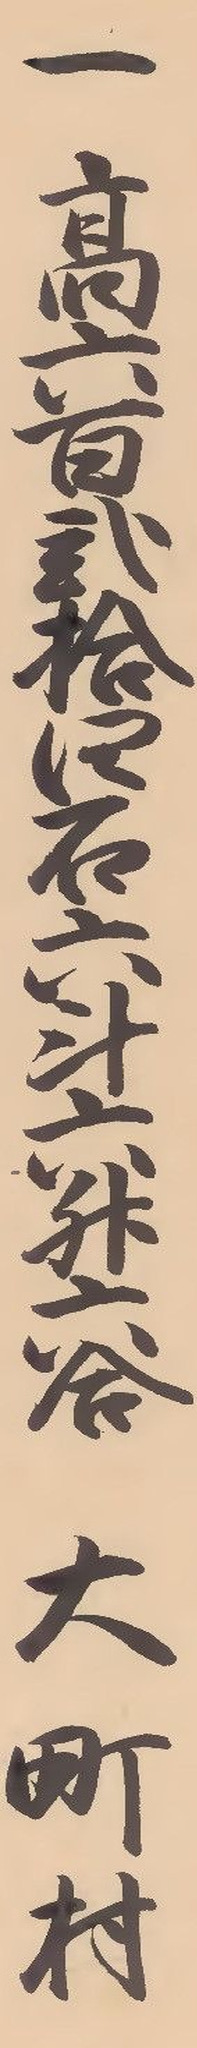一高六百弐拾四石六斗六升六合大町村
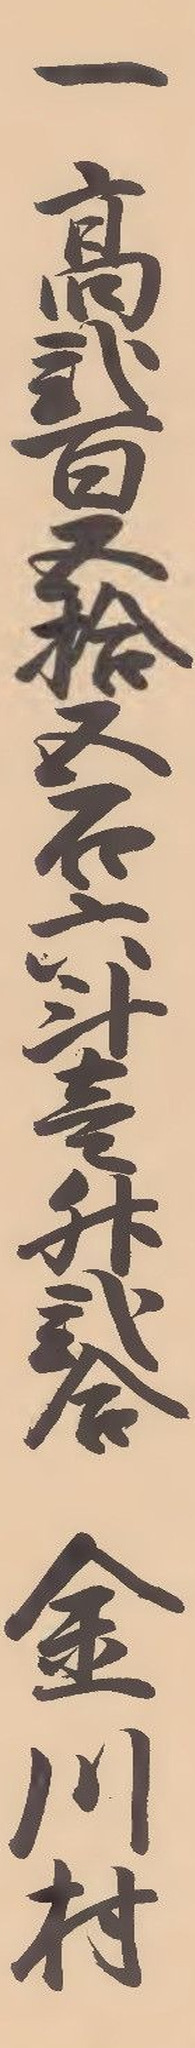一高弐百五拾五石六斗壱升弐合金川村
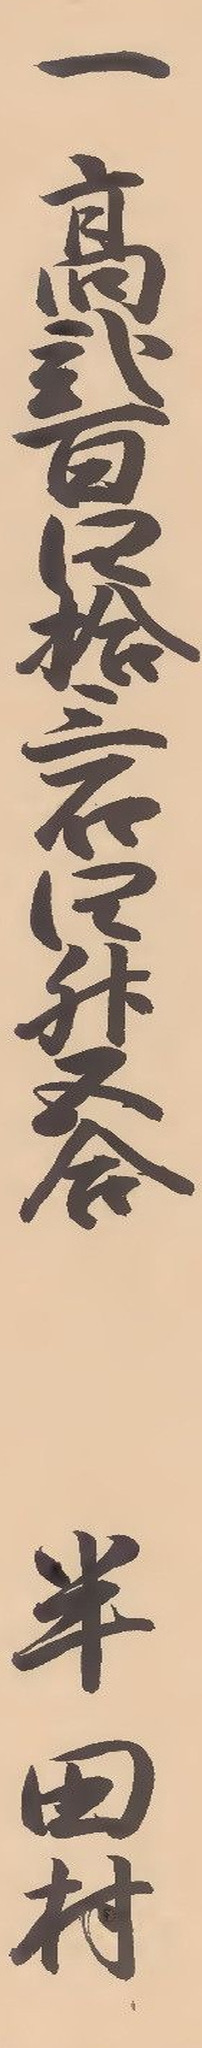一高弐百四拾三石四升五合半田村
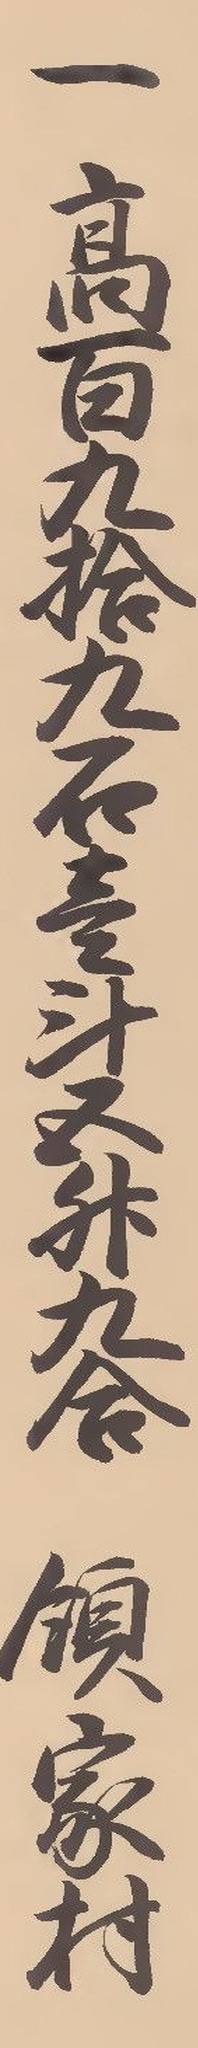一高百九拾九石壱斗五升九合領家村
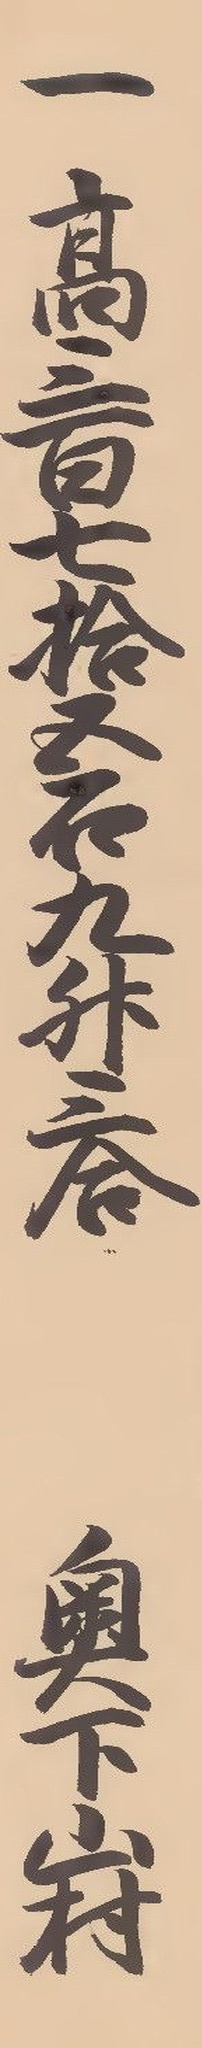一高三百七拾五石九升三合奥下山村
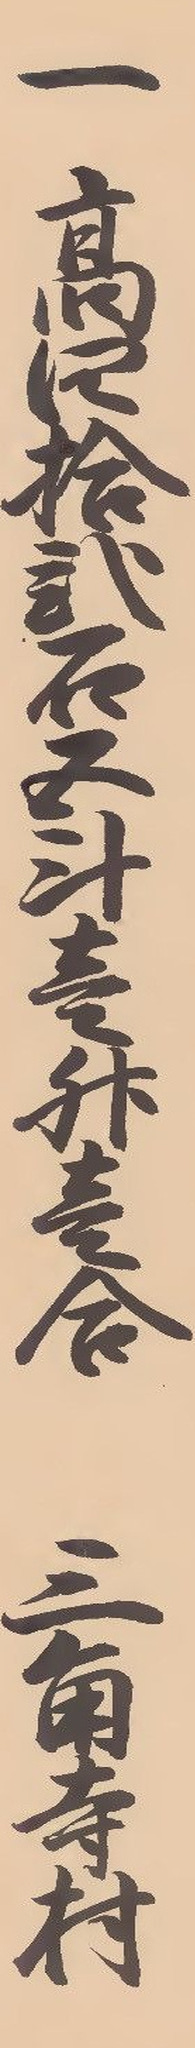一高四拾弐石五斗壱升壱合三角寺村

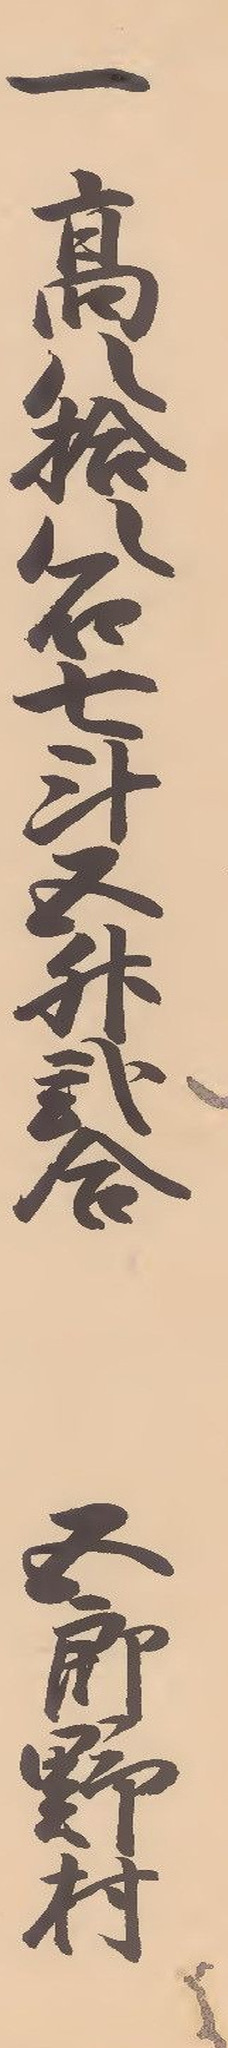一高八拾八石七斗五升弐合五郎野村
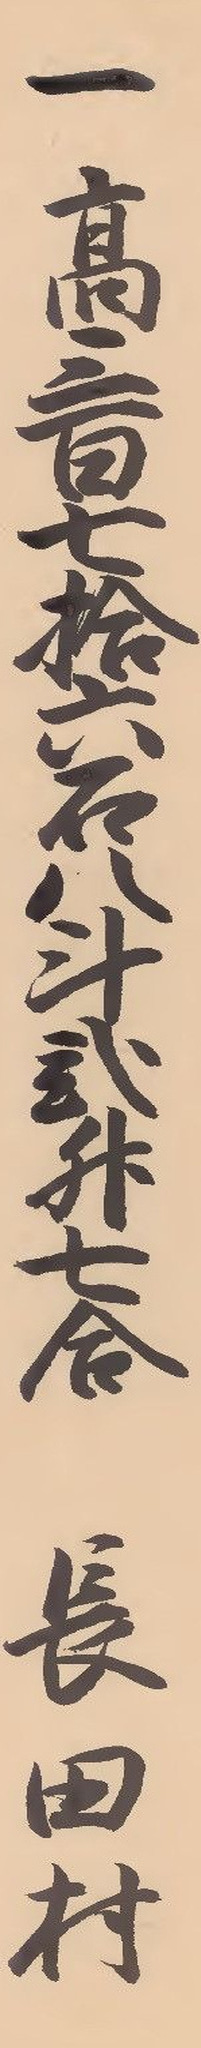一高三百七拾六石八斗弐升七合長田村
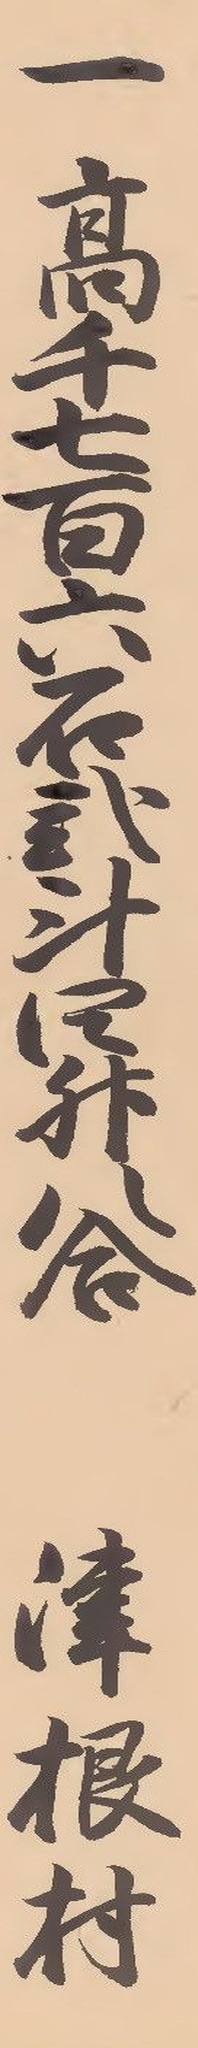一高千七百六石弐斗四升八合津根村
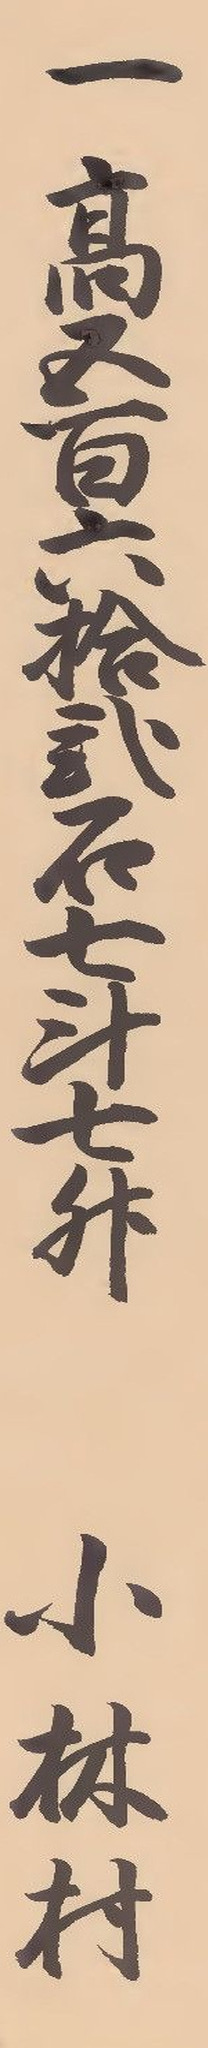一高五百六拾弐石七斗七升小林村
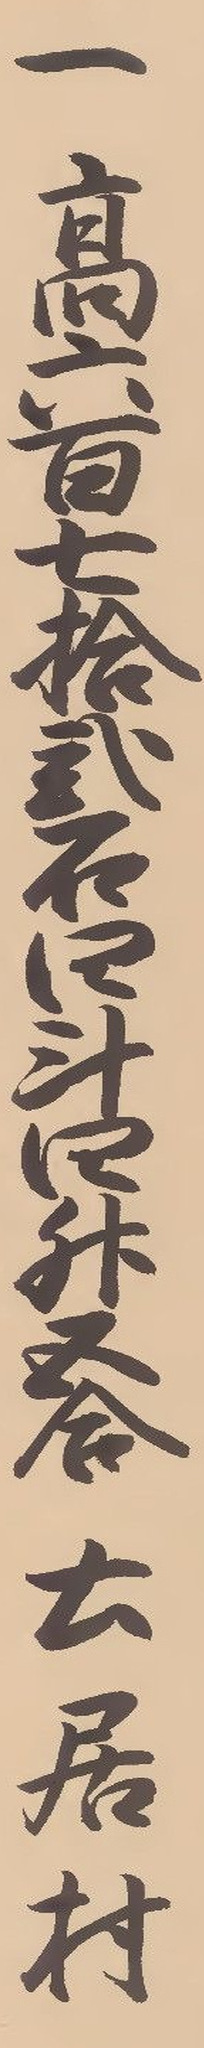一高六百七拾弐石四斗四升五合土居村
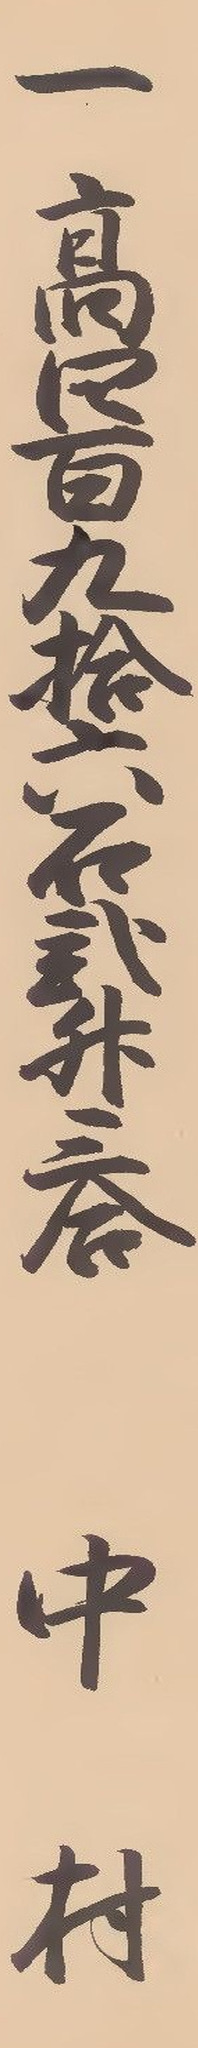一高四百九拾六石弐升三合中村
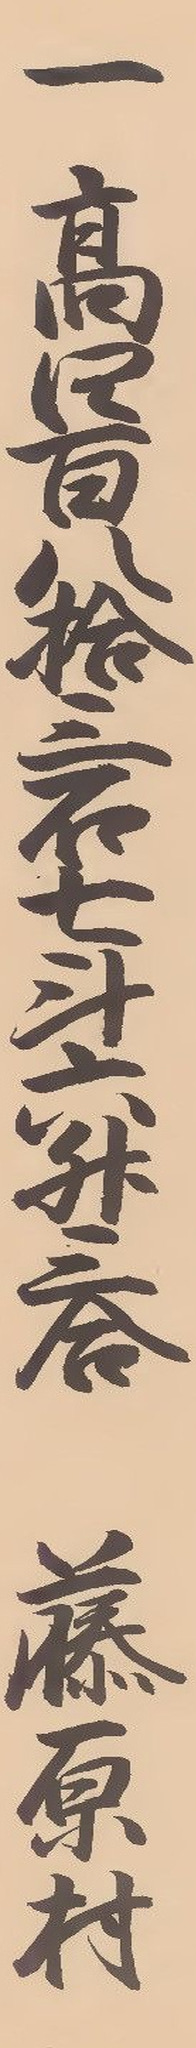一高四百八拾三石七斗六升三合藤原村
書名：伊予国郷帳
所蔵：国立公文書館 National Archives of Japan
